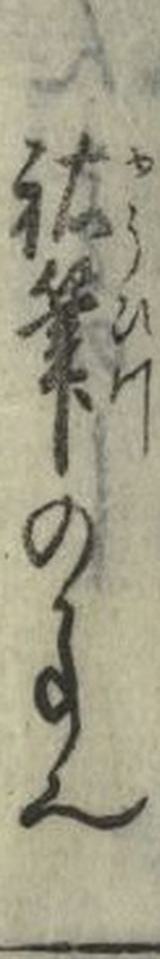祐筆の事也
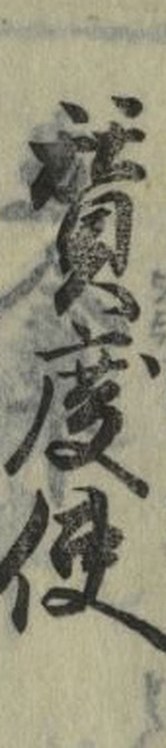賛度使
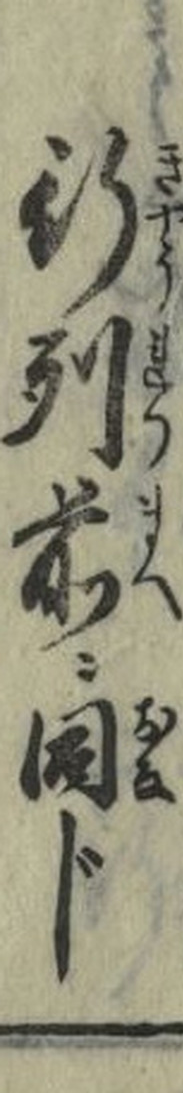行列前に同じ
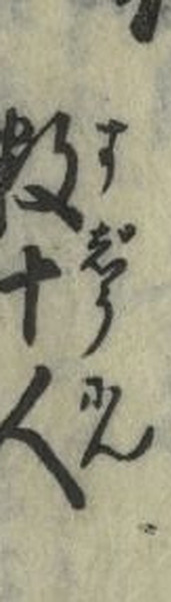数十人
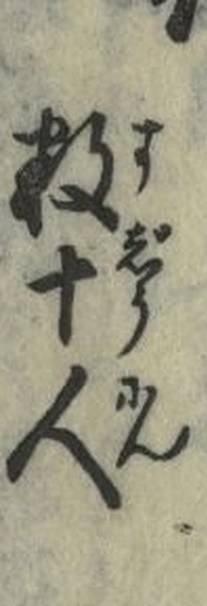数十人
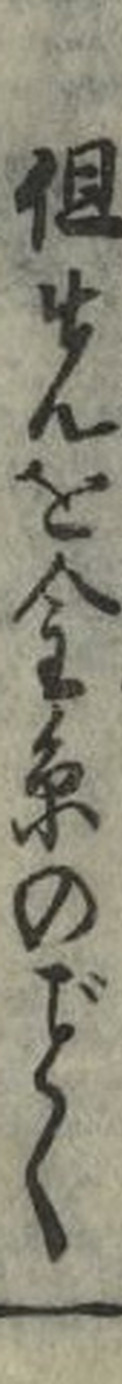但先を金糸のごとく
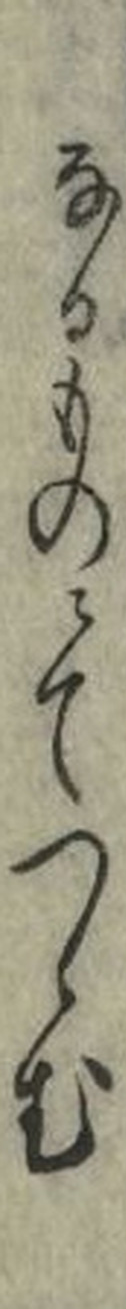なるものにてつゝむ

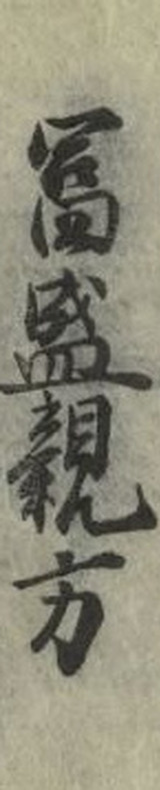冨盛親方
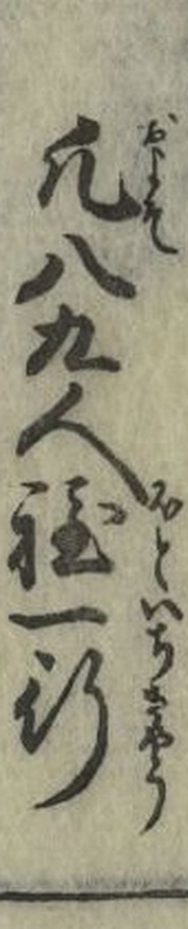凡八九人程一行
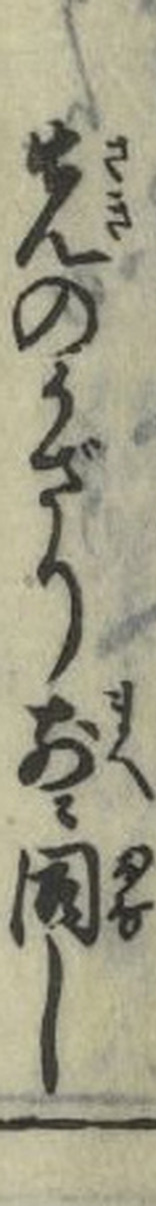先のかざり前に同し
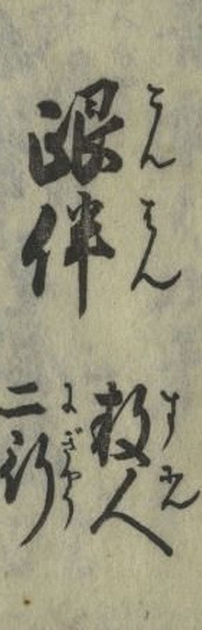跟伴数人
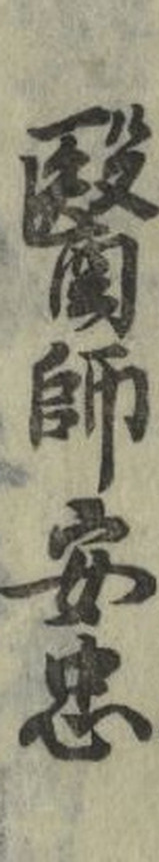醫師安忠
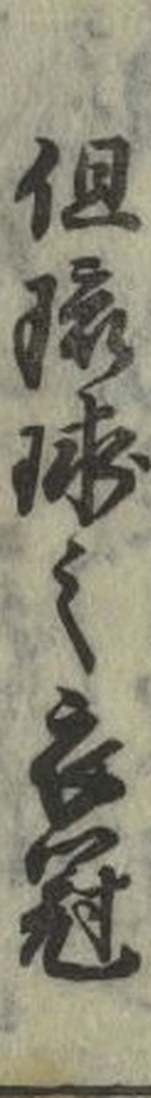但琉球衣冠
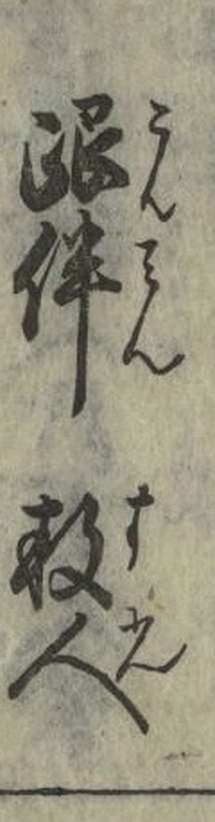跟伴数人

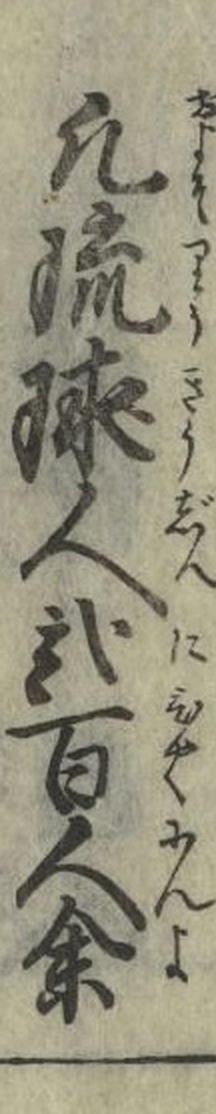凡琉球人弐百人余
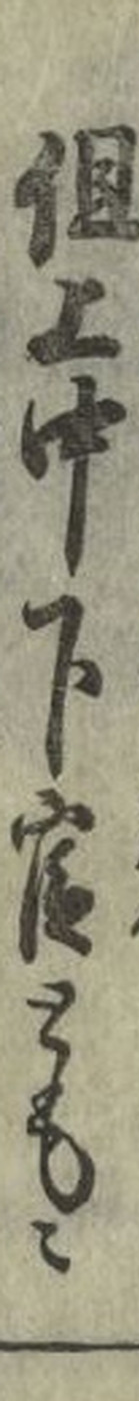但上中下官ともに
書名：琉球人大行列記
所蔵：University of the Ryukyus Library
